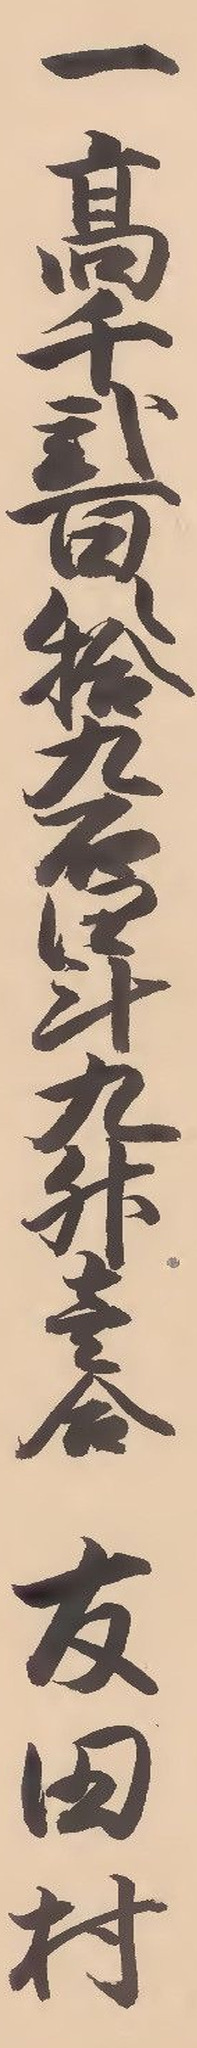一高千弐百八拾九石四斗九升壱合友田村

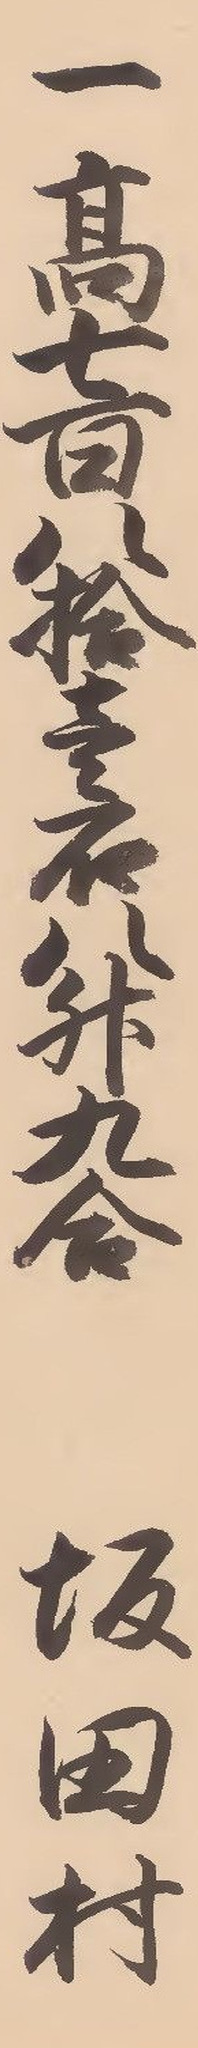一高七百八拾壱石八升九合坂田村
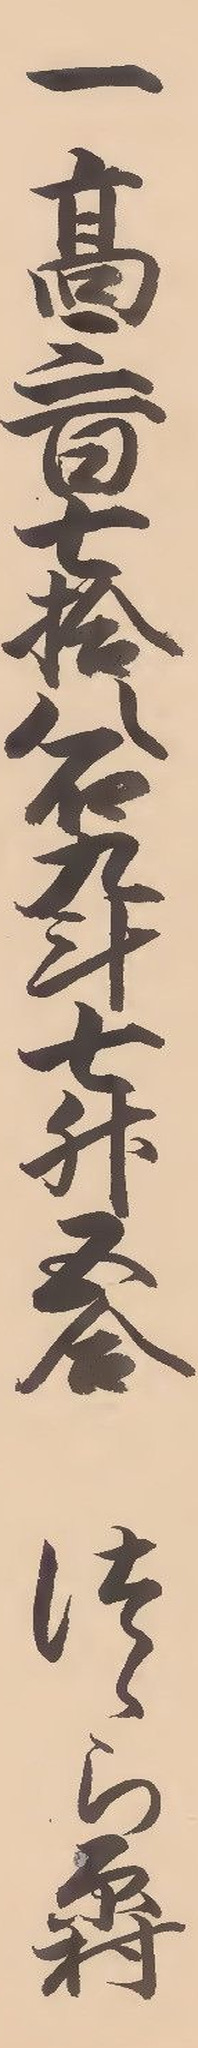一高三百七拾八石九斗七升五合つゝら原村
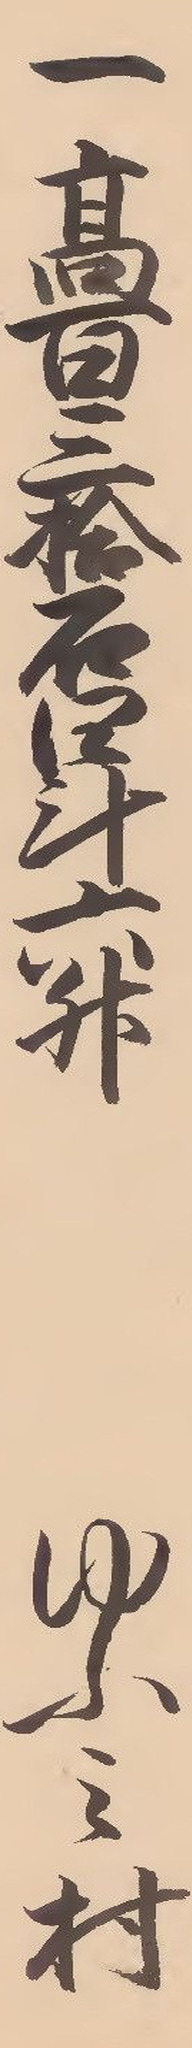一高百三拾石四斗六升ゆふみ村
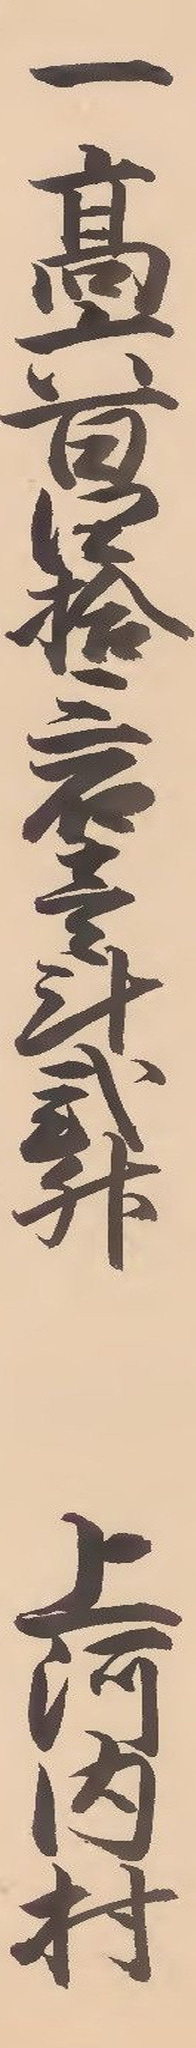一高六百四拾三石壱斗弐升上河内村
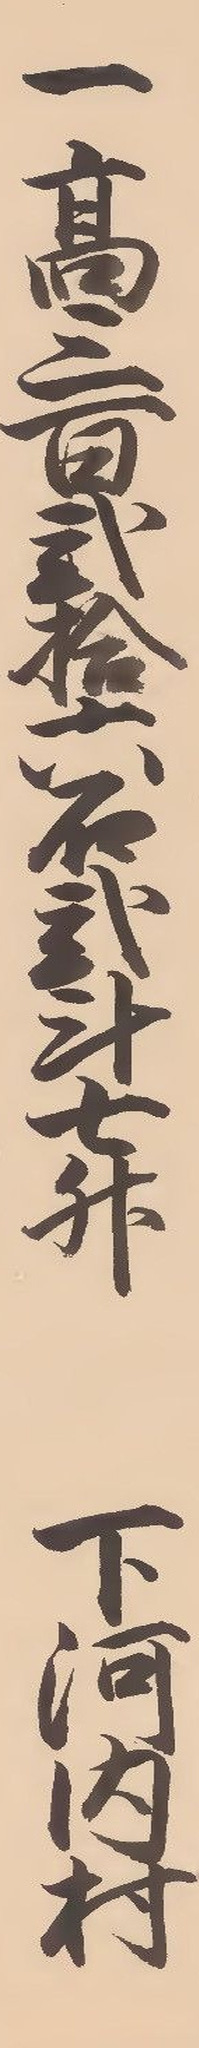一高三百弐拾六石弐斗七升下河内村
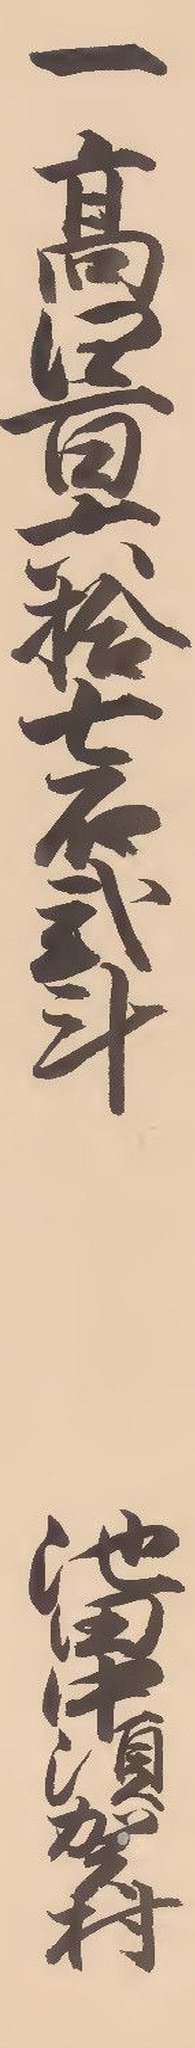一高四百六拾七石弐斗池田中須賀村
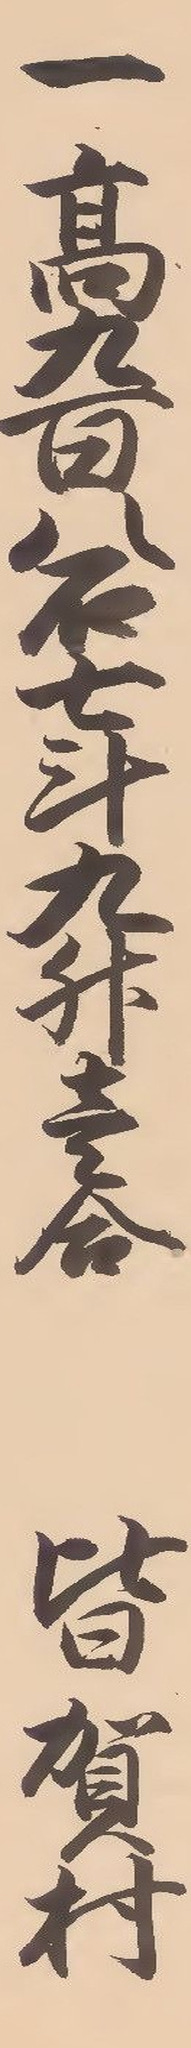一高九百八石七斗九升壱合皆賀村

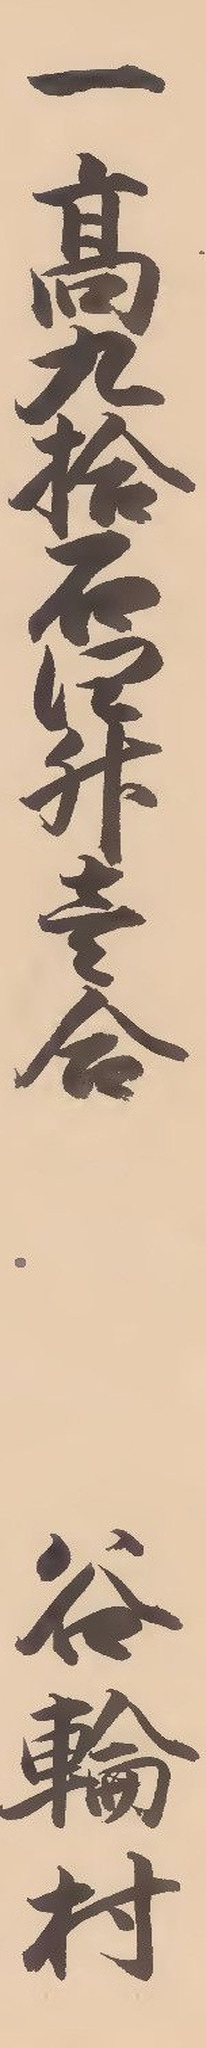一高九拾石四升壱合谷輪村
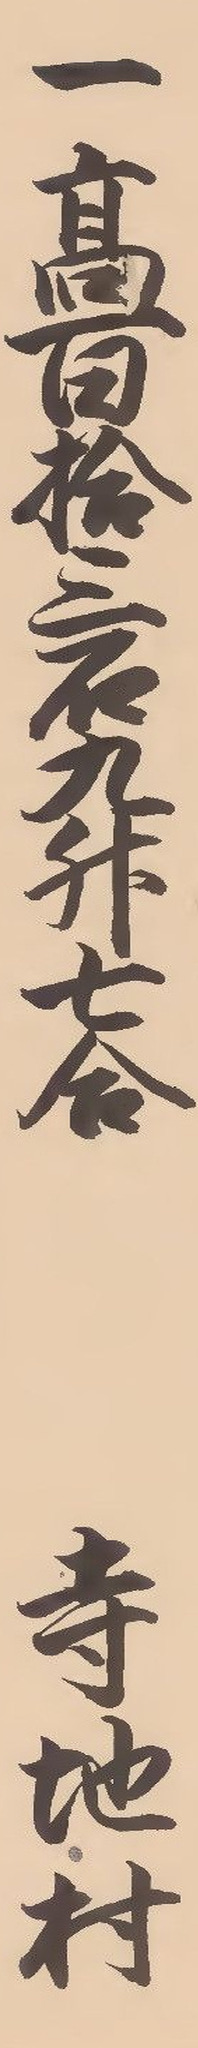一高百拾三石九升七合寺地村
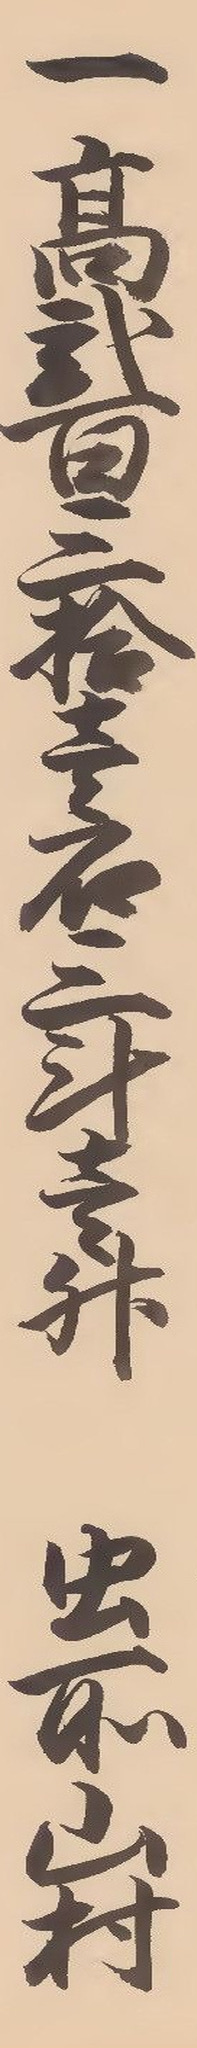一高弐百三拾壱石三斗壱升虫所山村
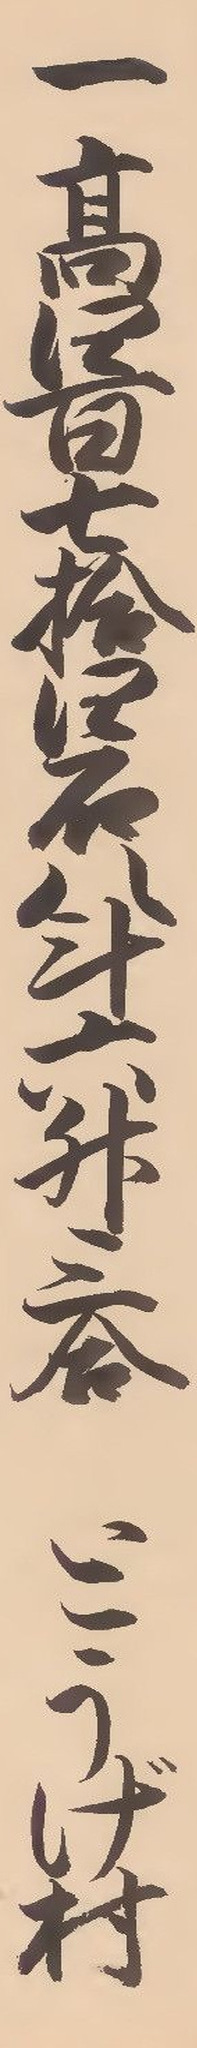一高四百七拾四石八斗六升三合とうげ村
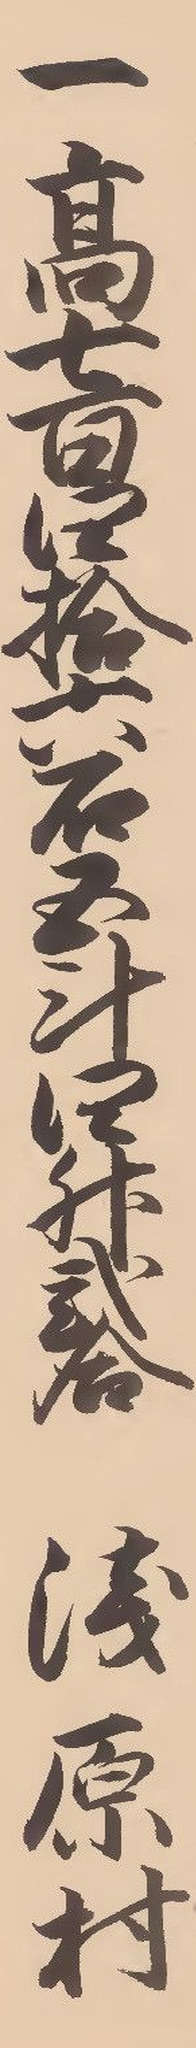一高七百四拾六石五斗四升弐合浅原村
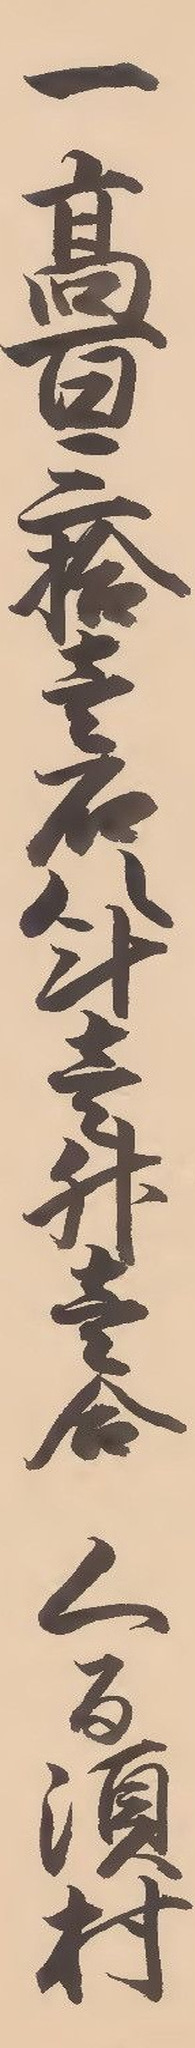一高百三拾壱石八斗壱升壱合くる須村
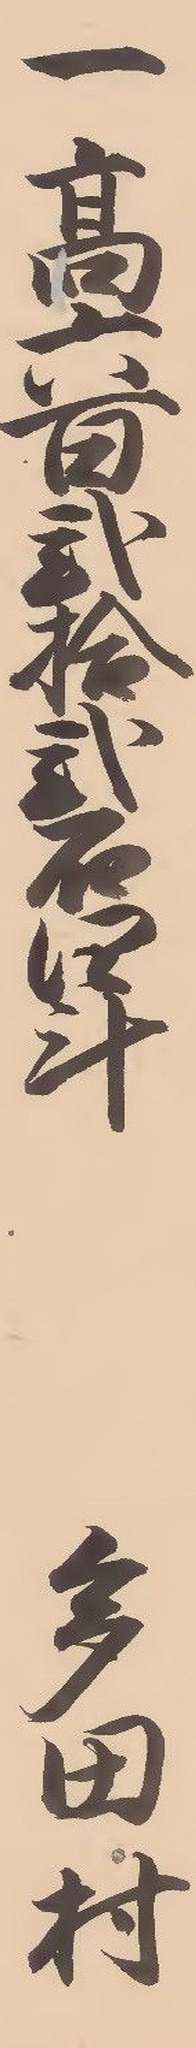一高六百弐拾弐石四斗多田村

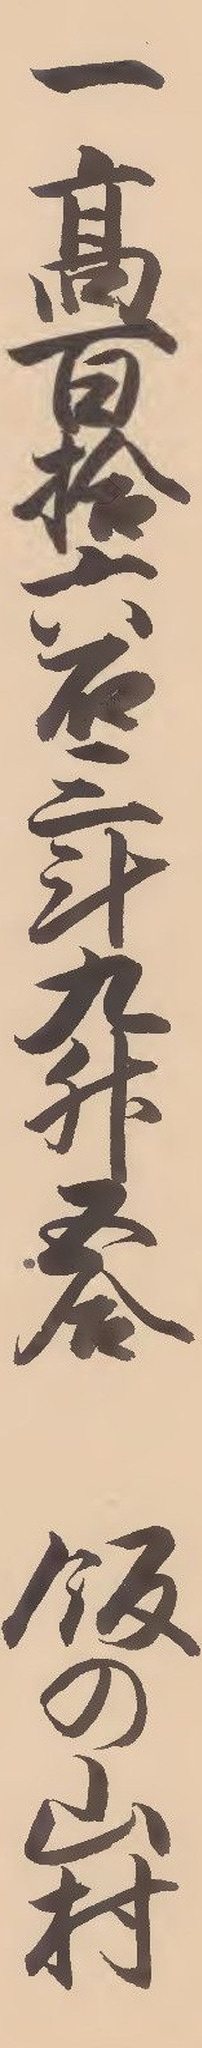一高百拾六石三斗九升五合飯の山村
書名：安芸国郷帳
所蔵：国立公文書館 National Archives of Japan
